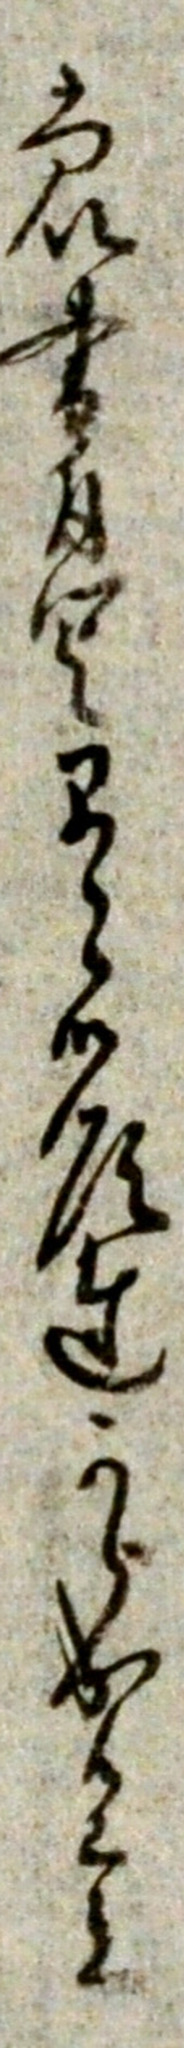尚以書付写早々御順達可ヒ成御座候
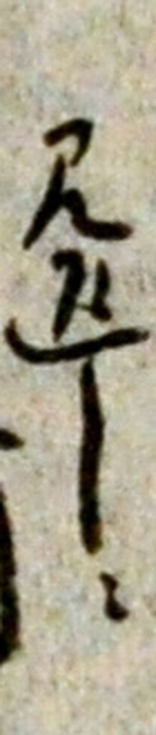見返しニ
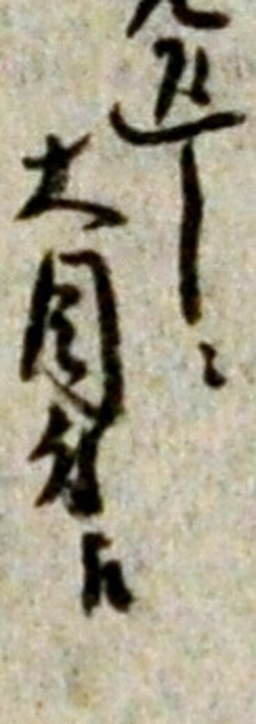大目付江
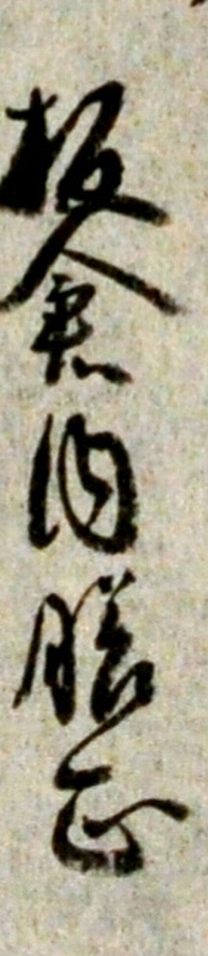板倉内膳正
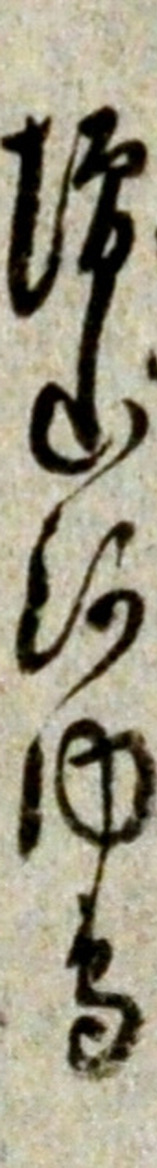増山河内守
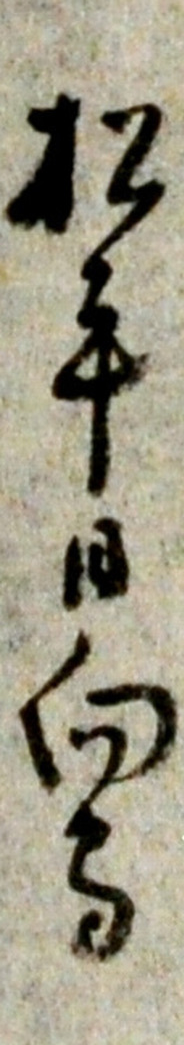松平日向守

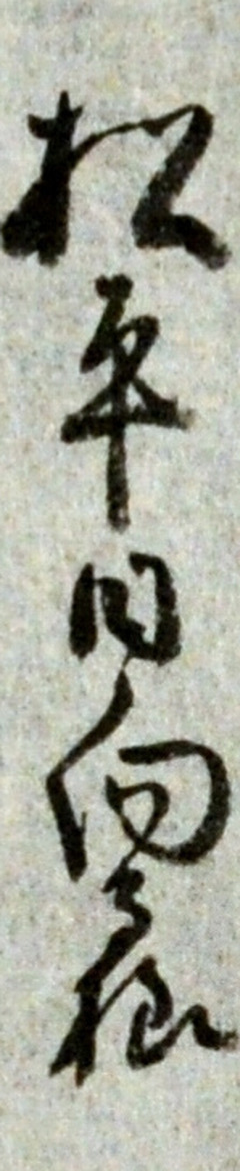松平日向守様
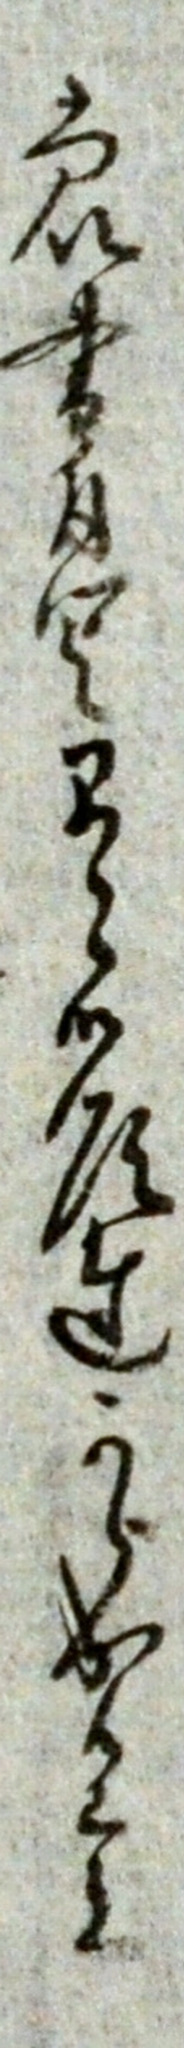尚以書付写早々御順達可ヒ成御座候
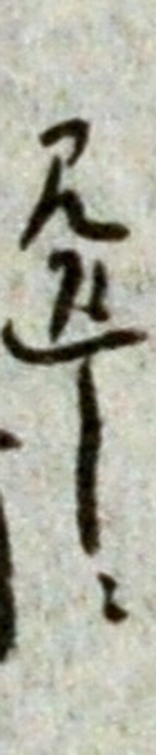見返しニ
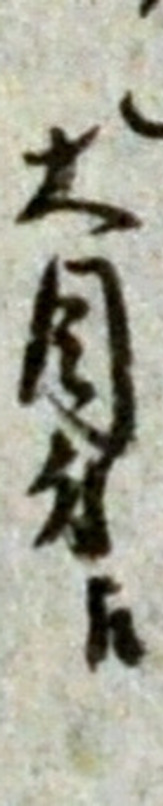大目付江
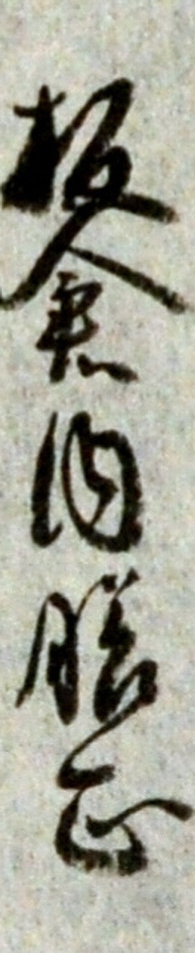板倉内膳正
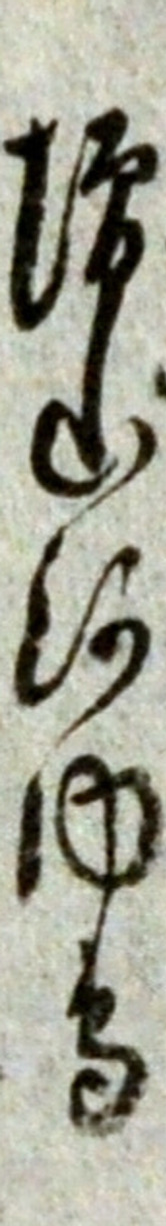増山河内守
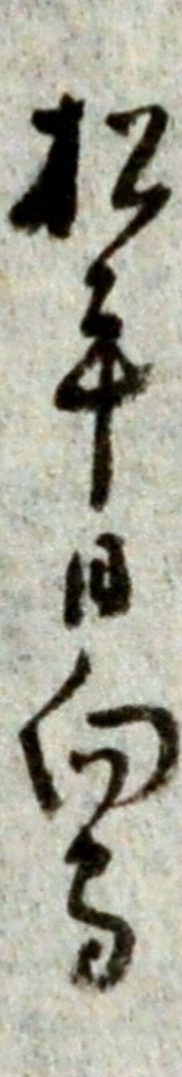松平日向守
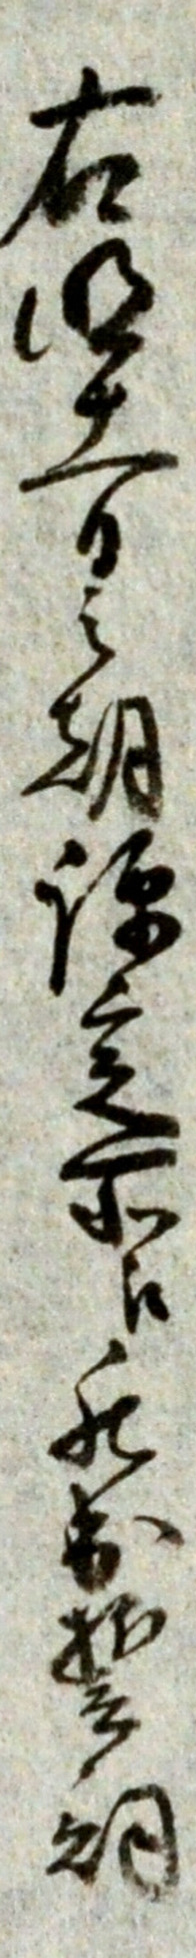右明十一日之朝評定所江被出誓詞
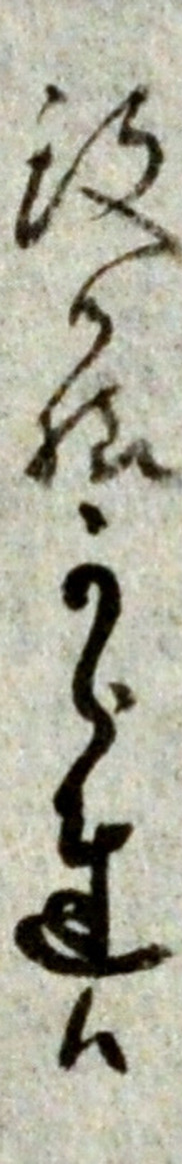改候様可ヒ達候
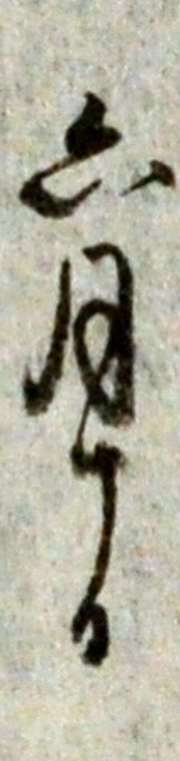六月十日
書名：大阪加番関係諸書留〔一括〕
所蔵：伊那市立高遠町図書館・合同会社AMANE
